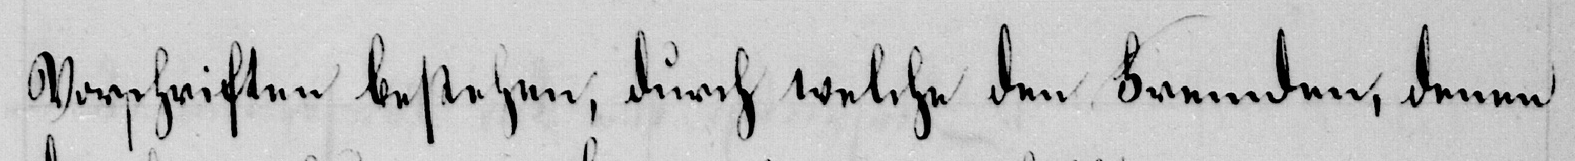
Vorschriften bestehen, durch welche den Fremden, denen
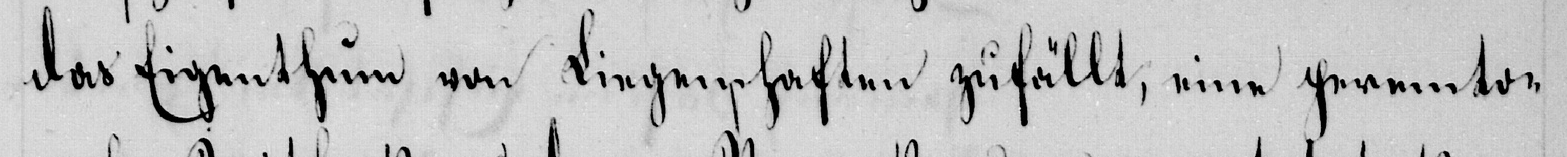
das Eigenthum von Liegenschaften zufällt, eine peremto¬
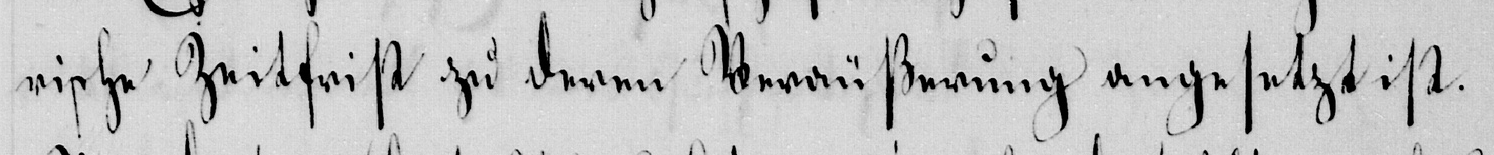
rische Zeitfrist zu deren Veräußerung angesetzt ist.
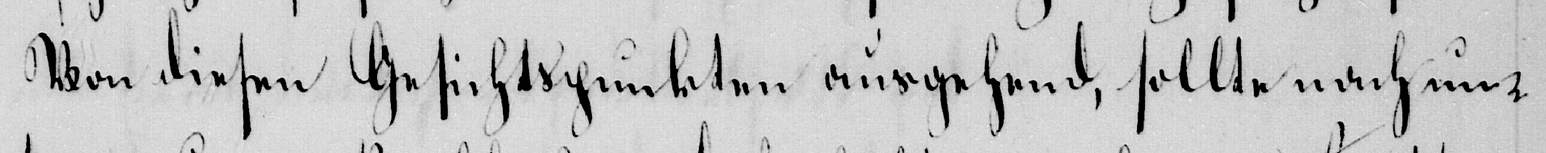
Von diesen Gesichtspunkten ausgehend, sollte nach un¬
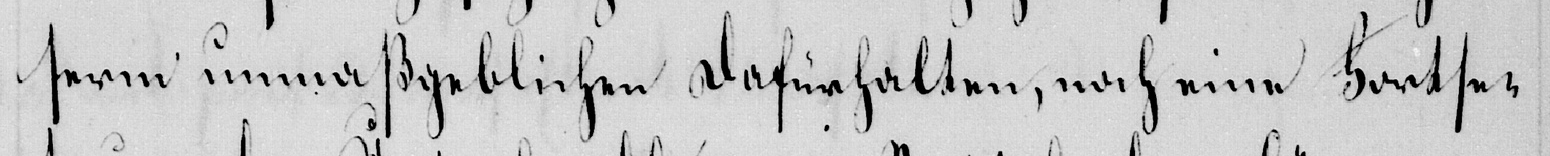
serm unmaßgeblichen Dafürhalten, noch eine Fortse¬
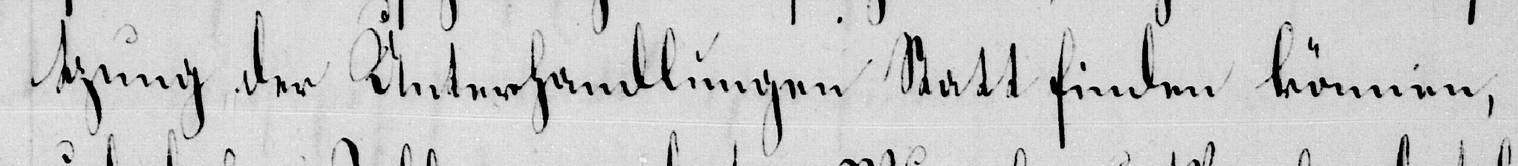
tzung der Unterhandlungen Statt finden können,
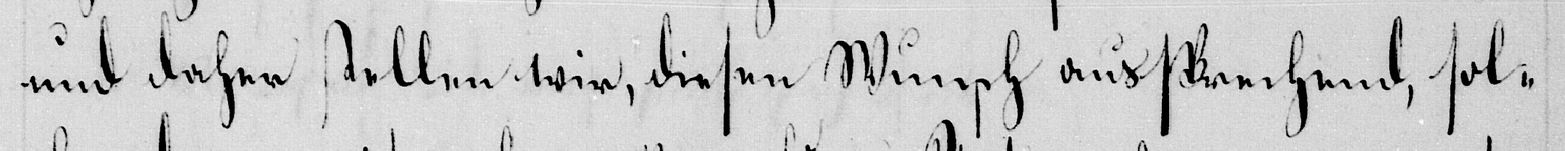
und daher stellen wir, diesen Wunsch aussprechend, sol¬
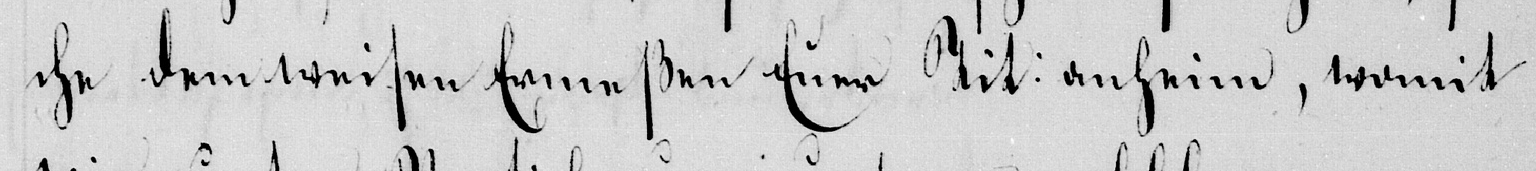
che dem weisen Ermeßen Euer Tit: anheim, womit
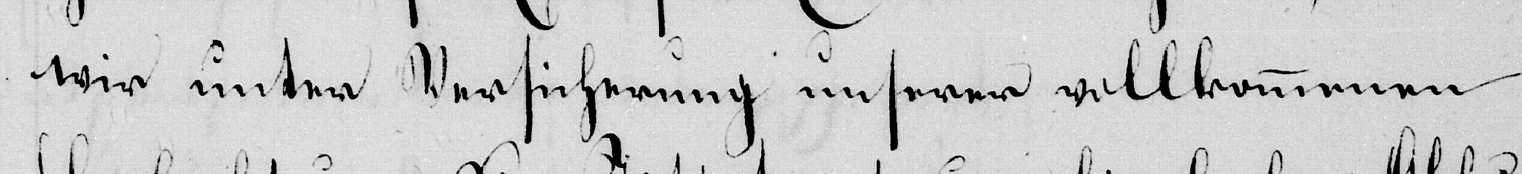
wir unter Versicherung unserer vollkommenen
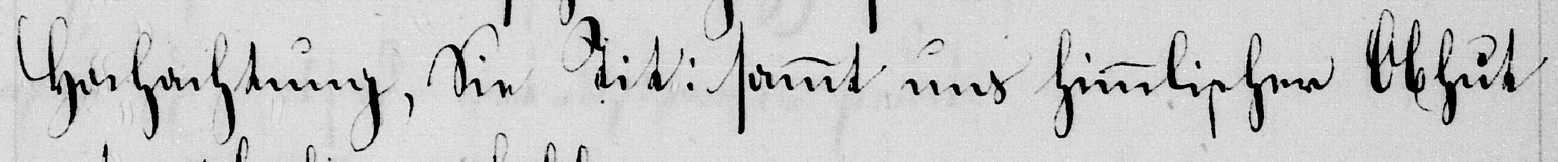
Hochachtung, die Tit: sammt uns himmlischer Obhut
